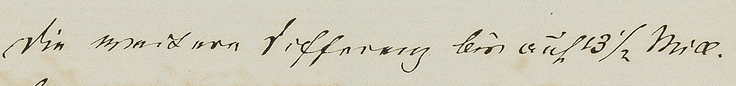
Die weitere Differenz bis auf 13½ Mill.
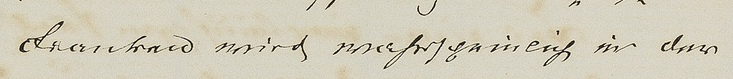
Franken wird wahrscheinlich in der
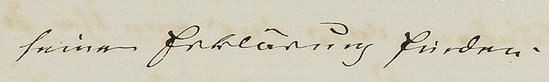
seine Erklärung finden. –
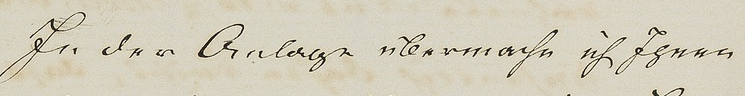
In der Anlage übermache ich Ihnen
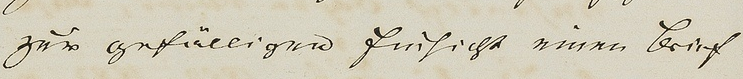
zur gefälligen Einsicht einen Brief
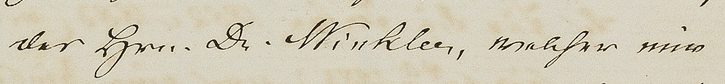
des Herrn Dr. Winkler , welcher mir
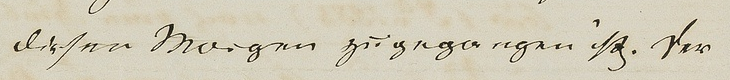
diesen Morgen zugegangen ist. Der
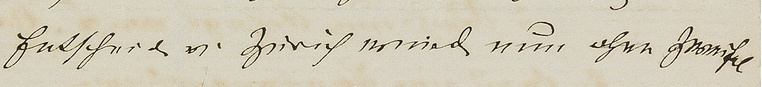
Entscheid v. Zürich wird nun ohne Zweifel
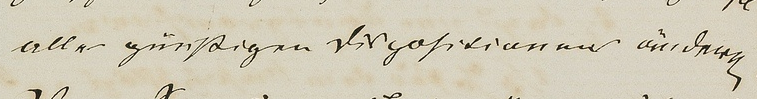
alle günstigen Dispositionen ändern.
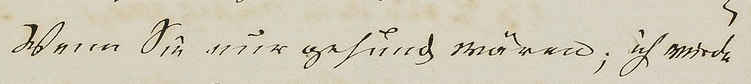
Wenn Sie nur gesund wären; ich würde
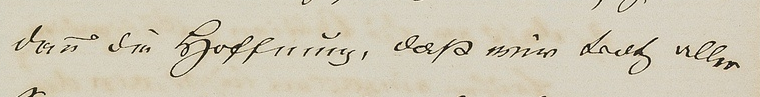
dann die Hoffnung, daß wir trotz aller
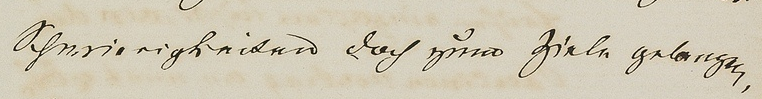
Schwierigkeiten doch zum Ziele gelangen,
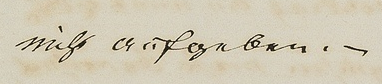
nicht aufgeben. –
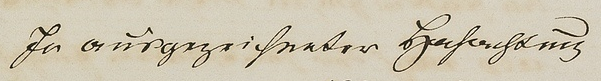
In ausgezeichneter Hochachtung
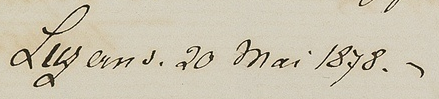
Luzern d. 20. Mai 1878.
